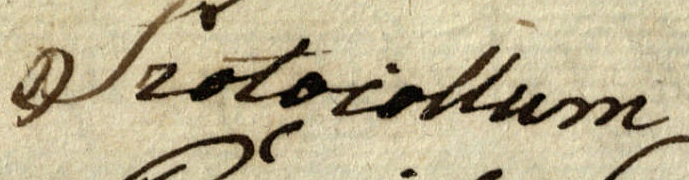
Protocollum
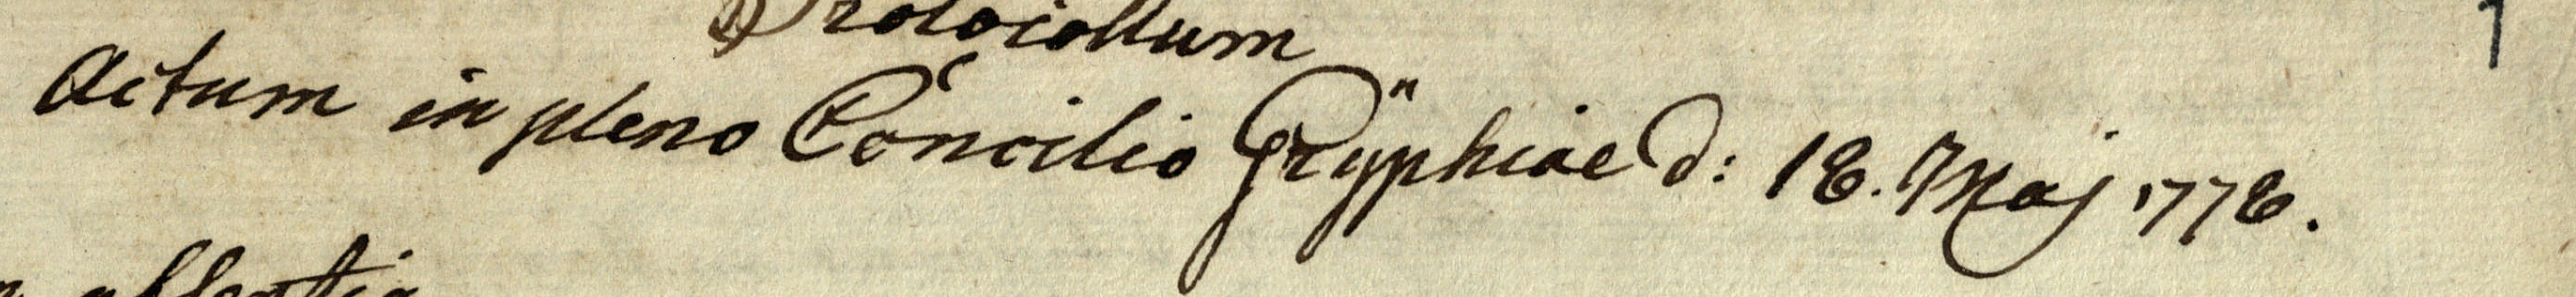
Actum in pleno Concilio Grÿphiae d. 18. Maj 1778.
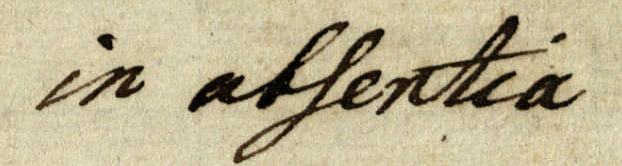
in absentia
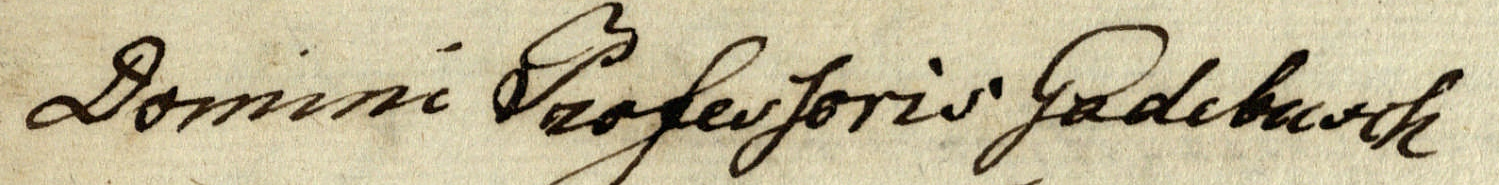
Domini Professoris Gadebusch
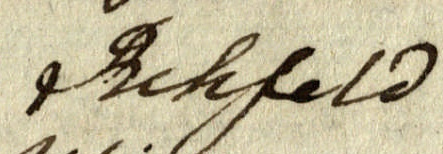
Rehfeld
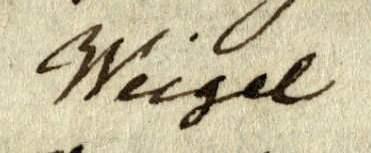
Weigel
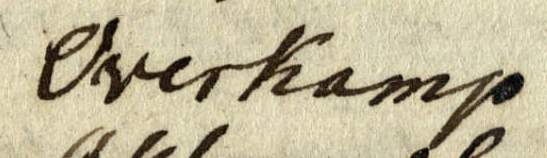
Overkamp
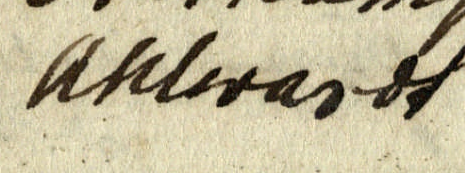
Ahlwardt
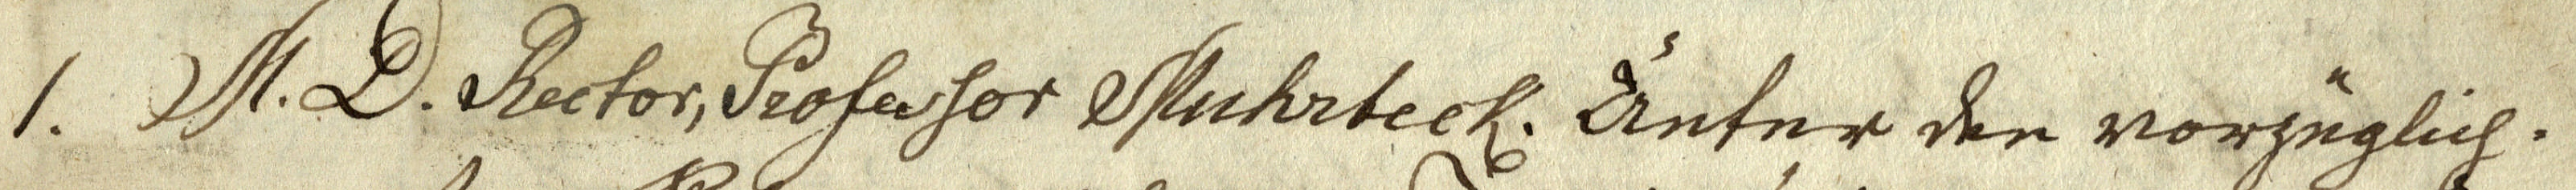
1. M. D. Rector, Professor Muhrbeck. Unter den vorzüglich¬
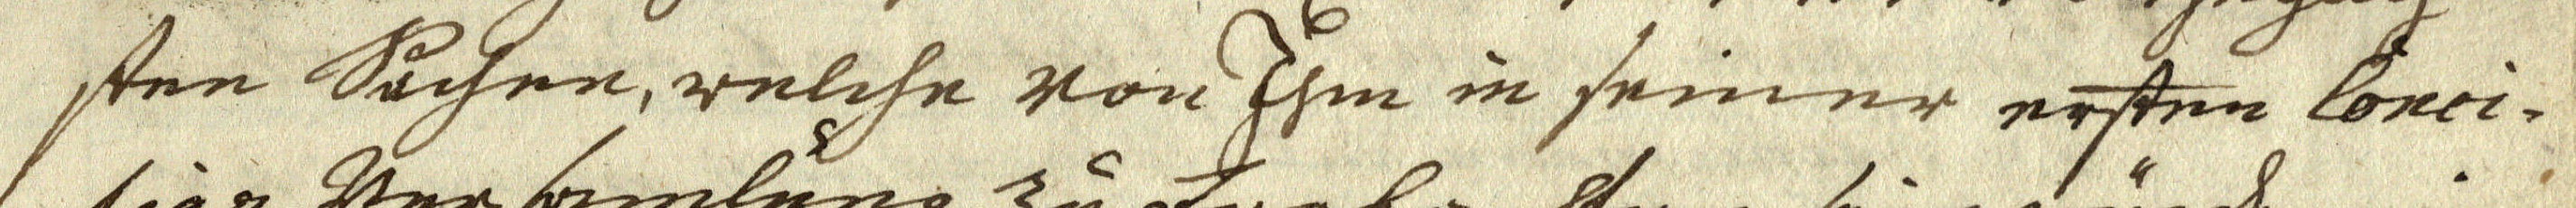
sten Sachen, welche von Ihm in seiner ersten Conci¬
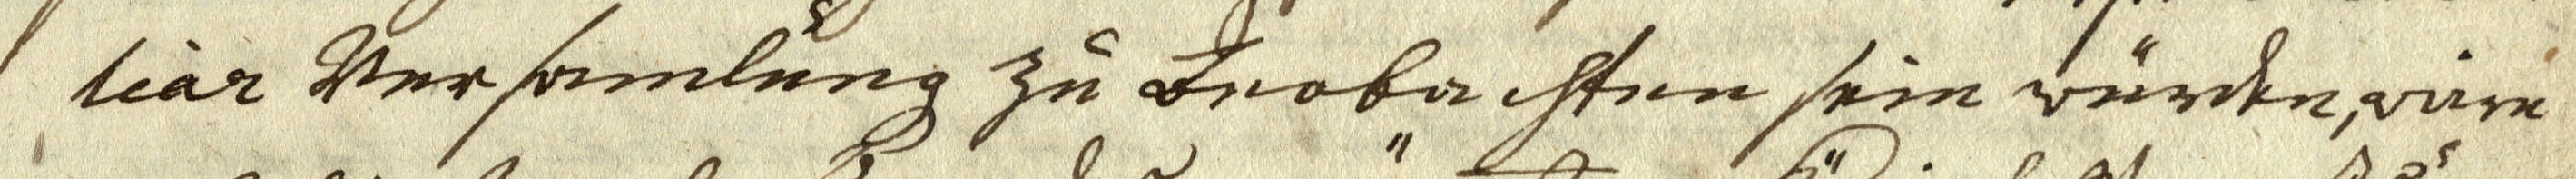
liar Versammlung zu beobachten sein würden, wäre
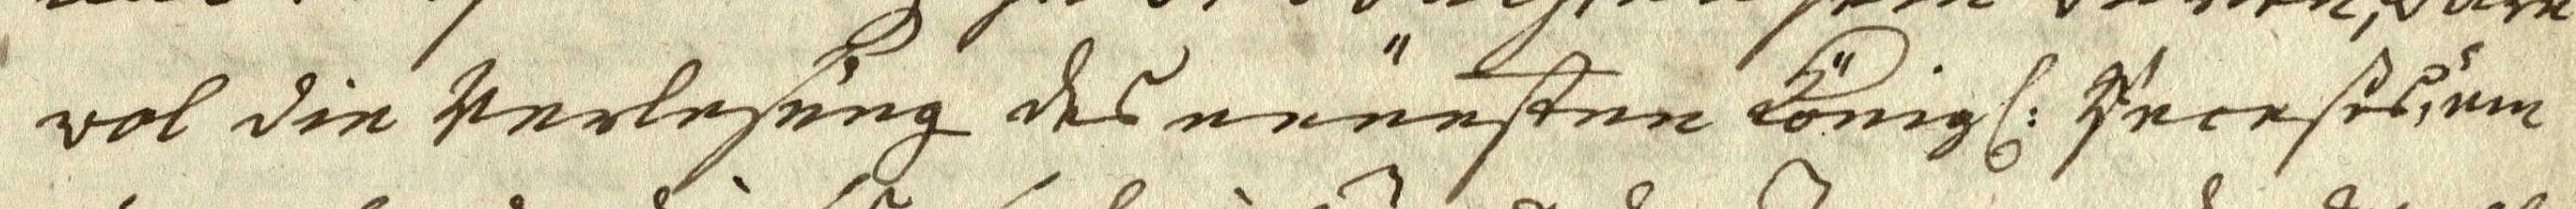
wol die Verlesung des neuesten Königl. Receßes, um
